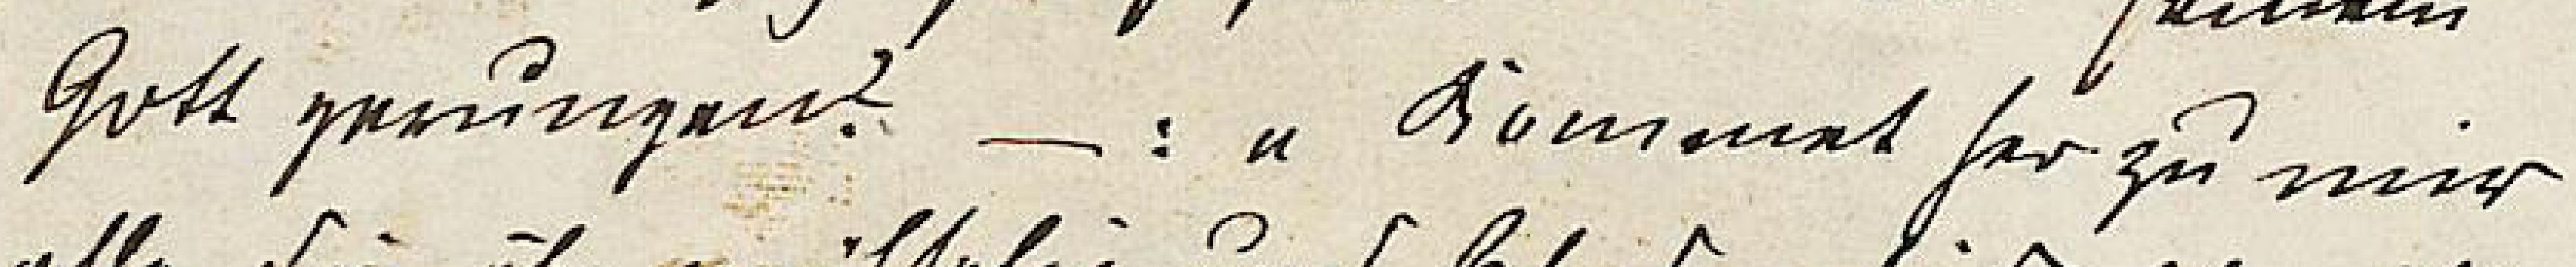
Gott gerungen? _ : "Kommet her zu mir
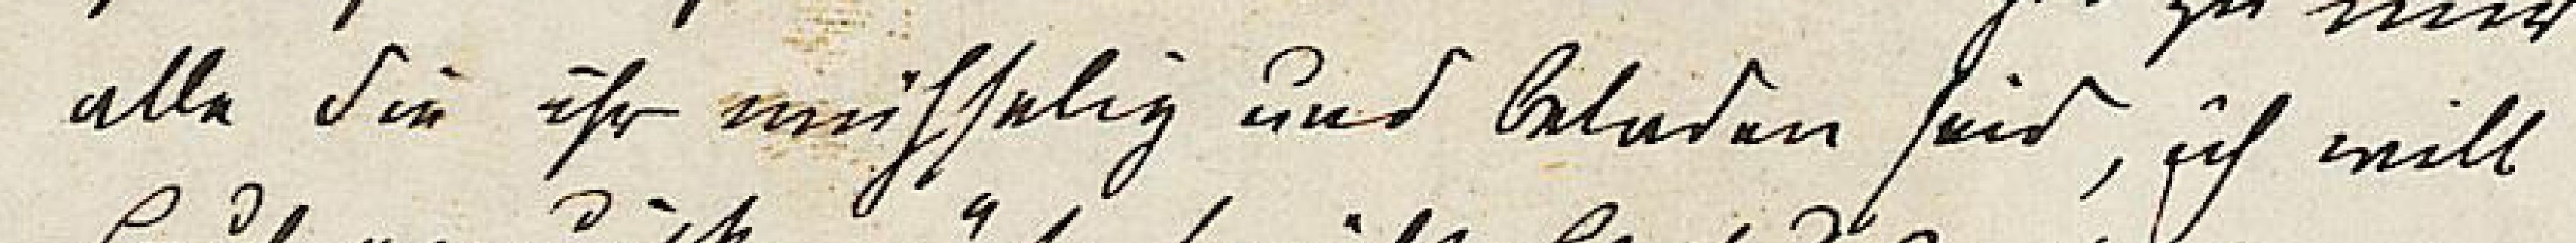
alle die ihr mühselig und beladen seid, ich will
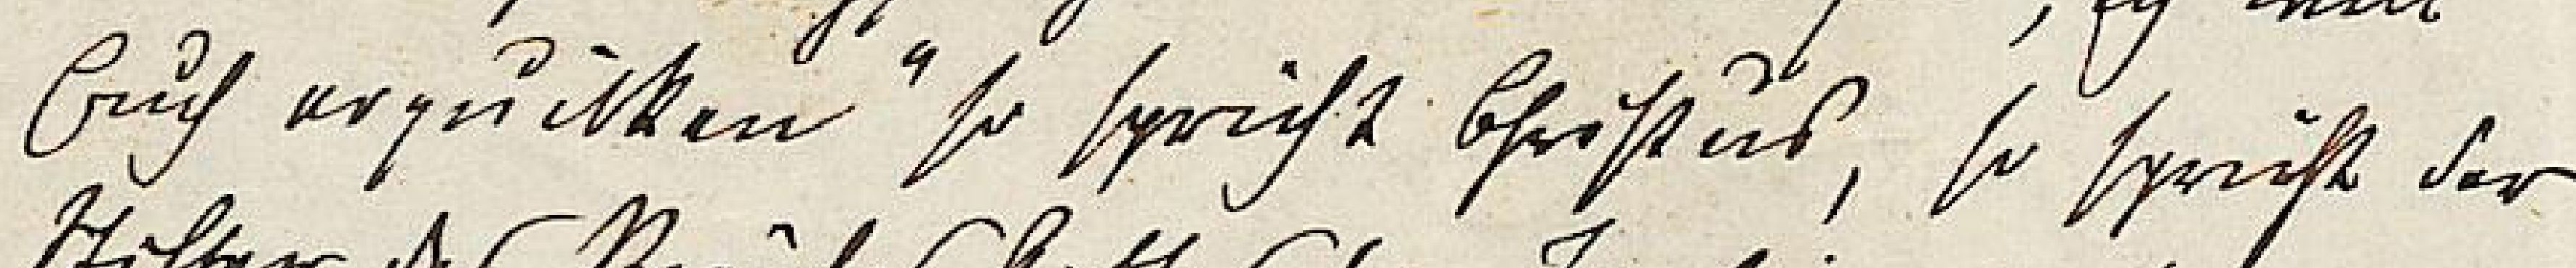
Euch erquicken" so spricht Christus, so spricht der
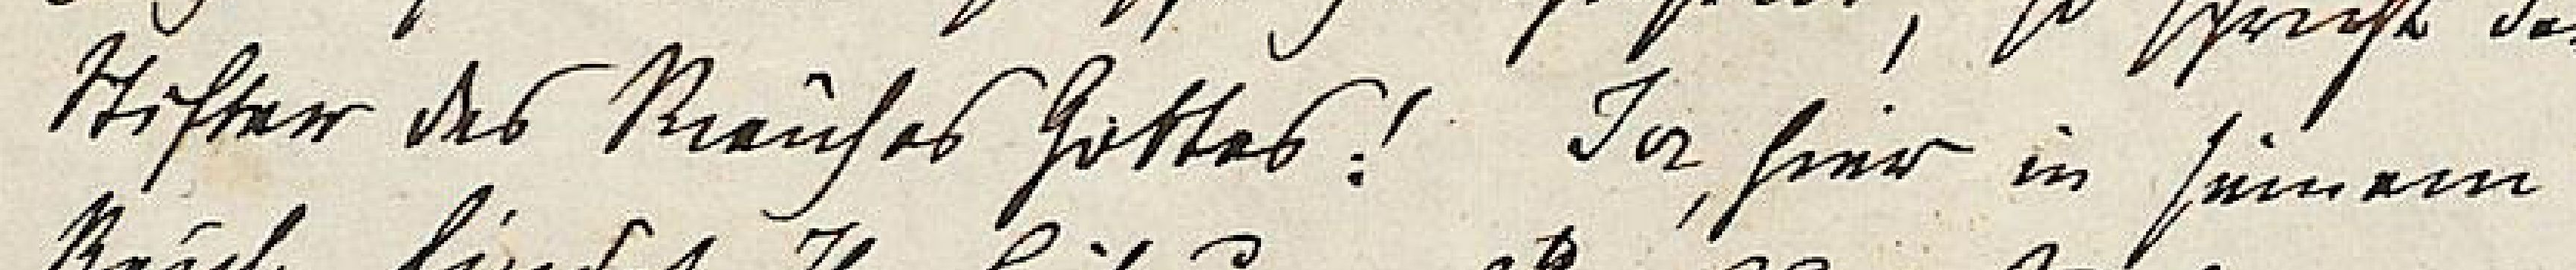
Stifter des Reiches Gottes! Ja, hier in seinem
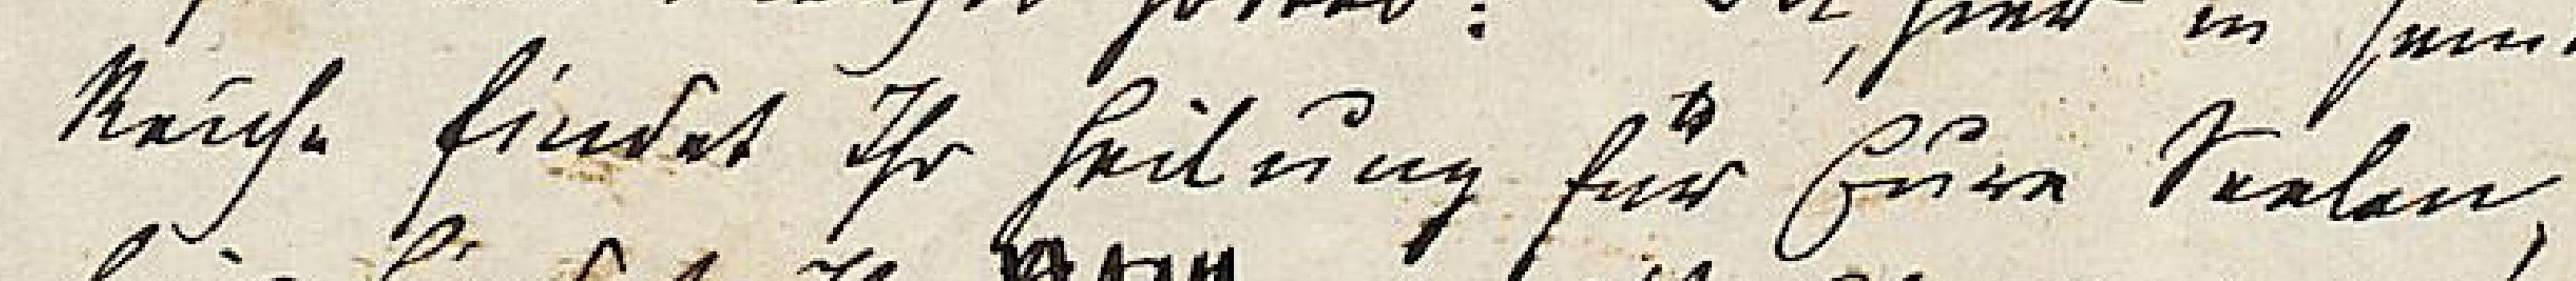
Reiche findet Ihr Heilung für Eure Seelen,
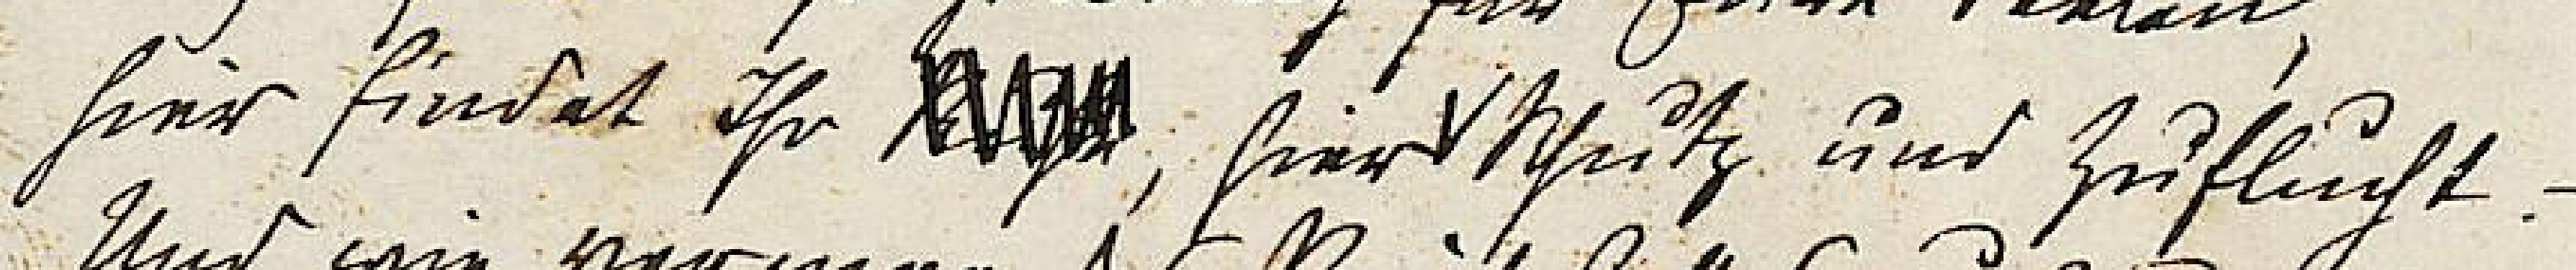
hier findet ihr Ruhe, hier V Schutz und Zuflucht.
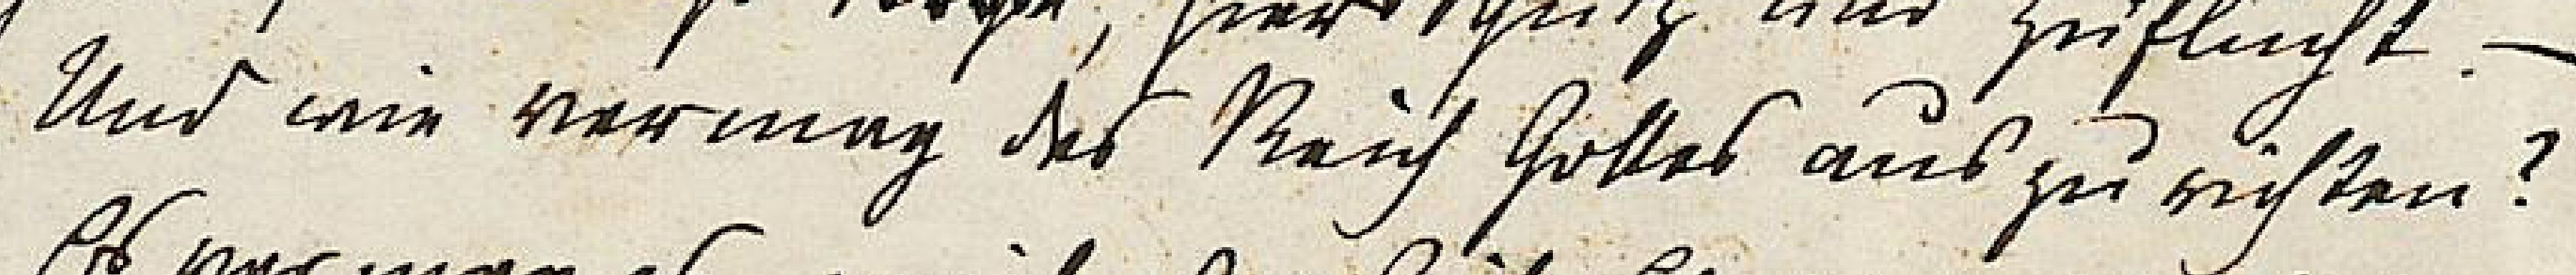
Und wie vermag das Reich Gottes auszurichten?
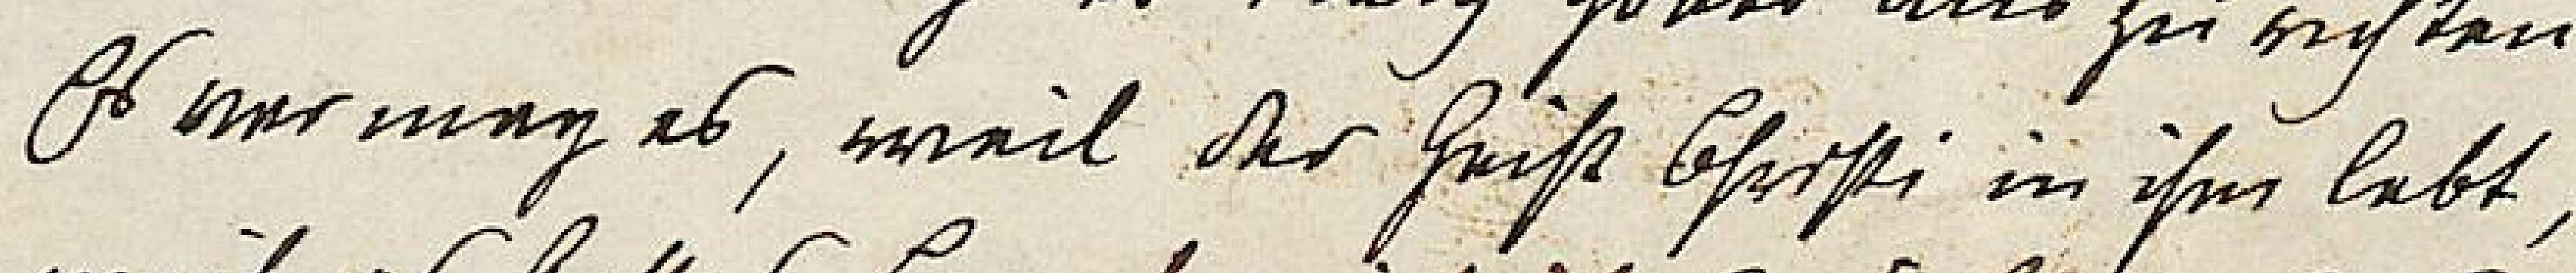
Es vermag es, weil der Geist Christi in ihm lebt,
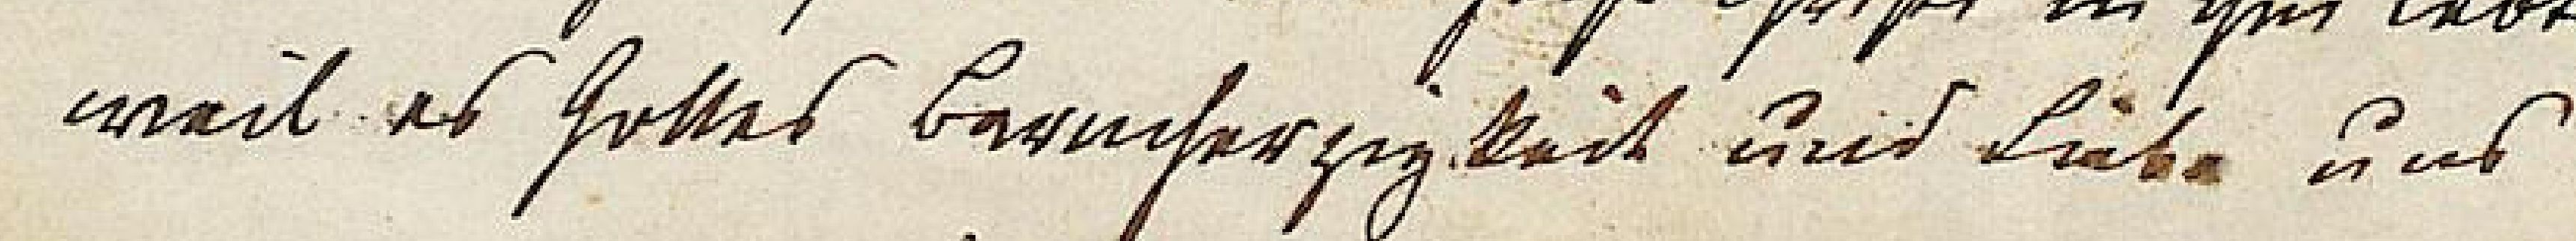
weil es Gottes Barmherzigkeit und Liebe aus
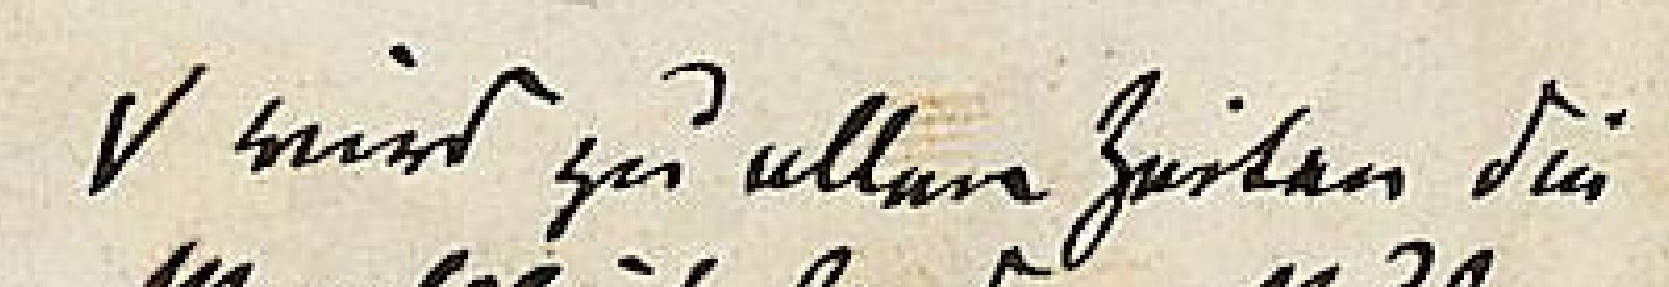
wird zu allen Zeiten die
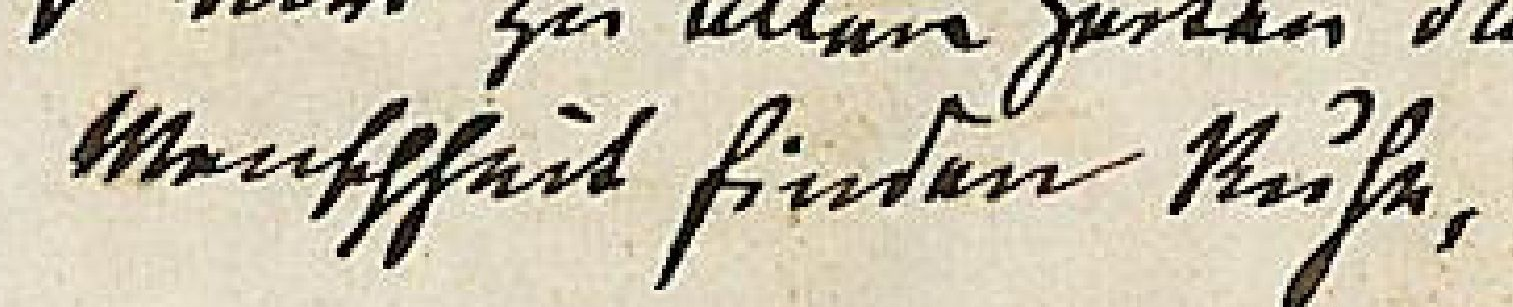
Menschheit finden Ruhe,
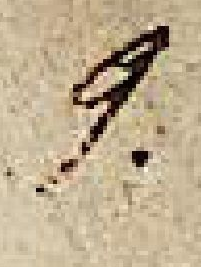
9.
